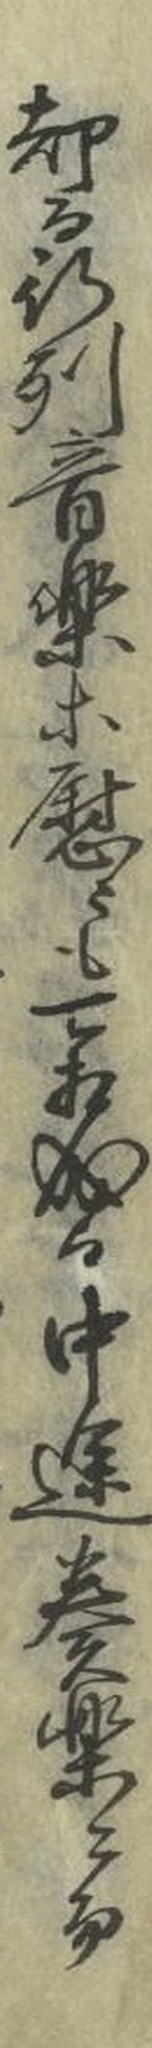却而行列音楽等慰にも可相成と中途奏楽に而
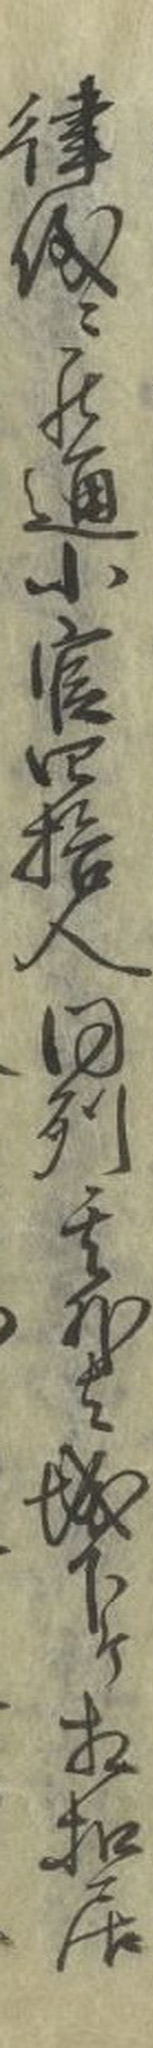律儀に罷通小官四拾人同列其外は城下え相控居
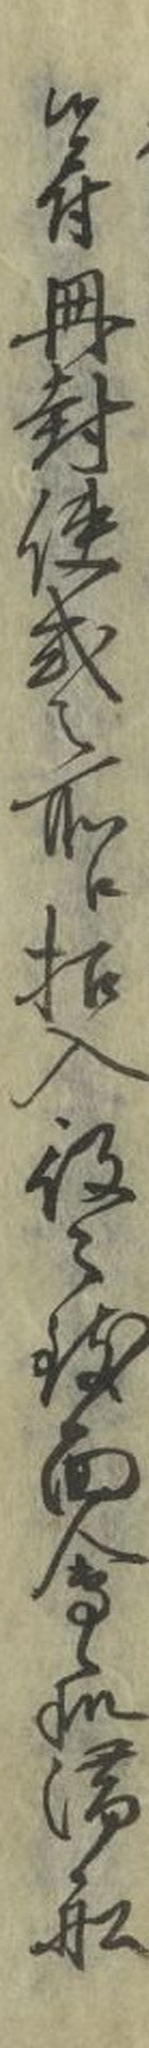候に付冊封使式之所え招入役々致面会候処滞船

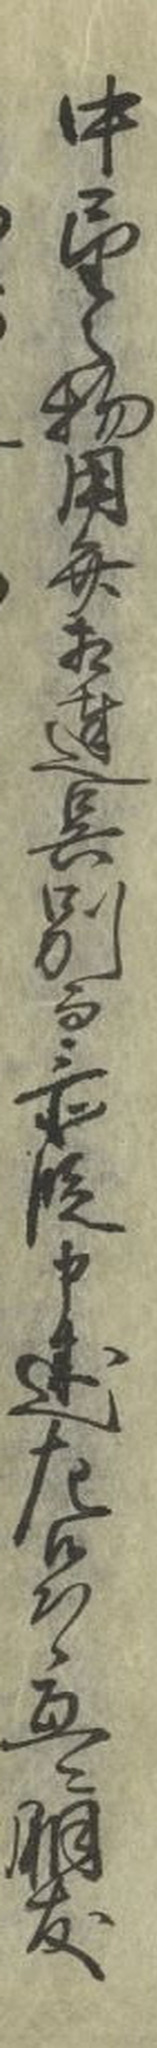中望之物用弁相達呉別而置段申述左候はゝ互に朋友
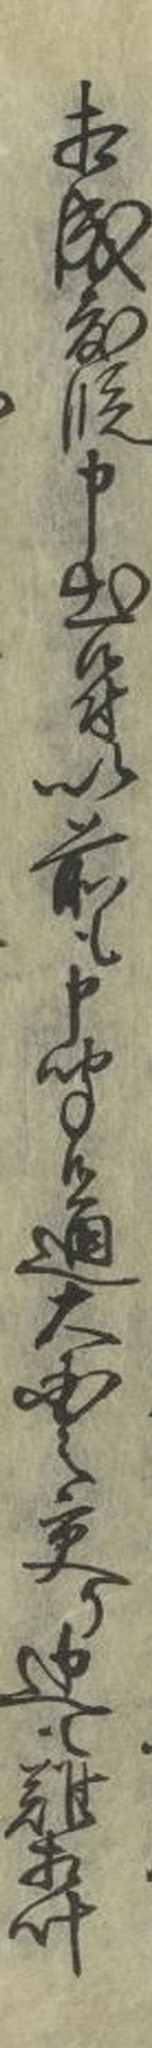相成度段申出候付以前も申聞候通大国之交り迚も難相叶
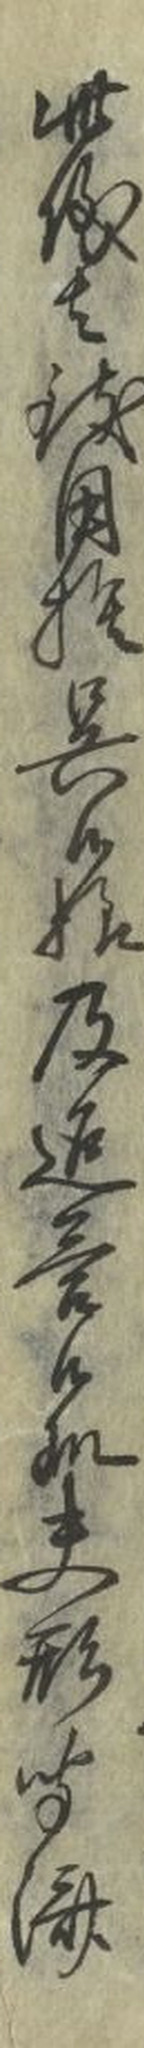此儀は致用捨呉候様及返答候処夫形聞済
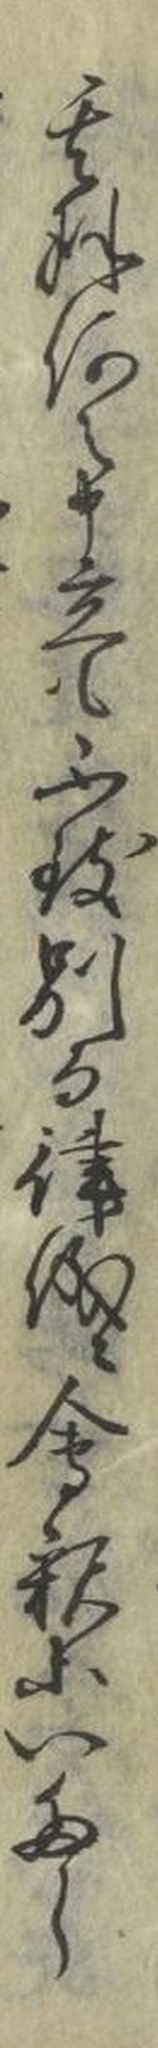其外何之申立も不致別而律儀に会釈等いたし
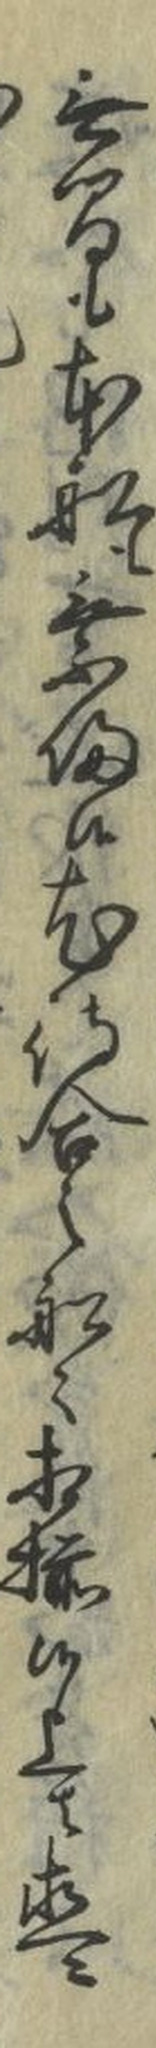無間も本船に乗帰候尤待合之船々相揃候上は直に
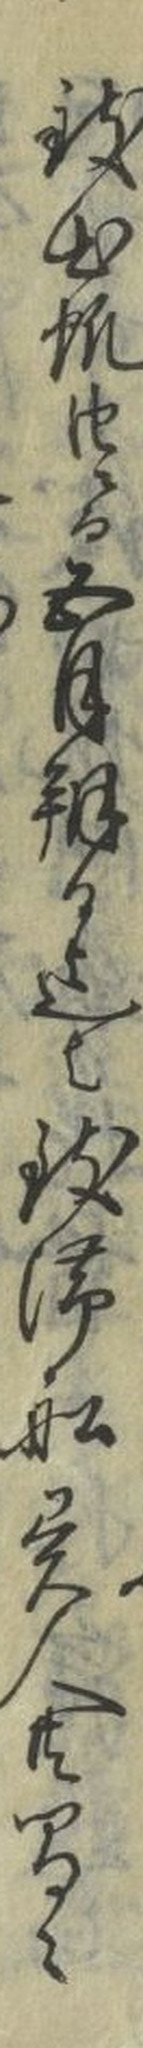致出帆由に而五月朔日迄は致滞船異人共間々
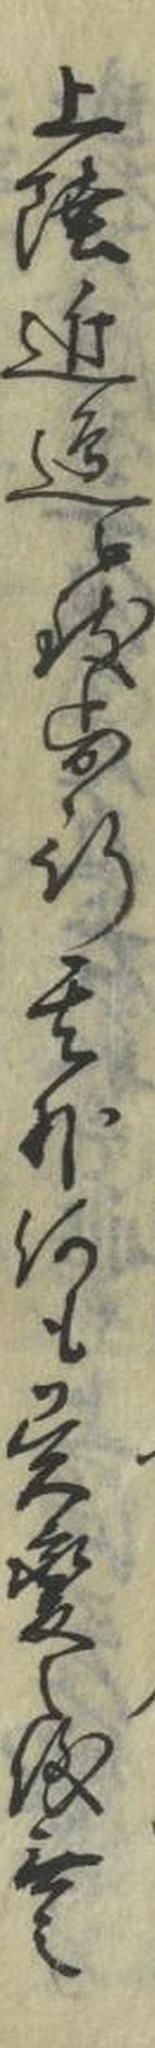上陸近辺え致歩行其外何も異変之儀無之
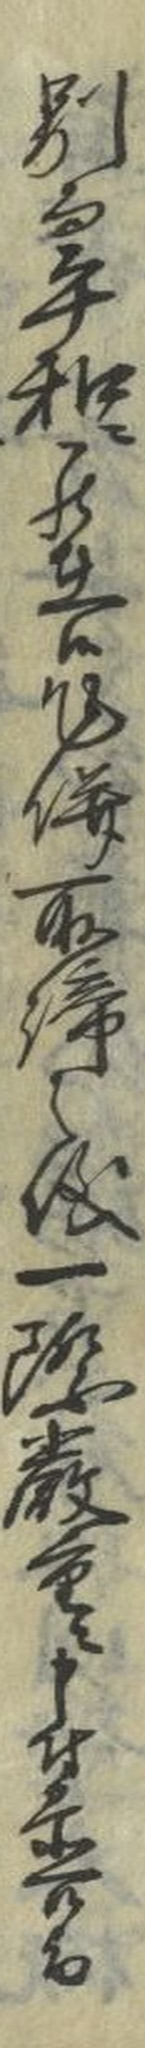別而平和に罷在候乍併取締之儀一際厳重に申付置候旨
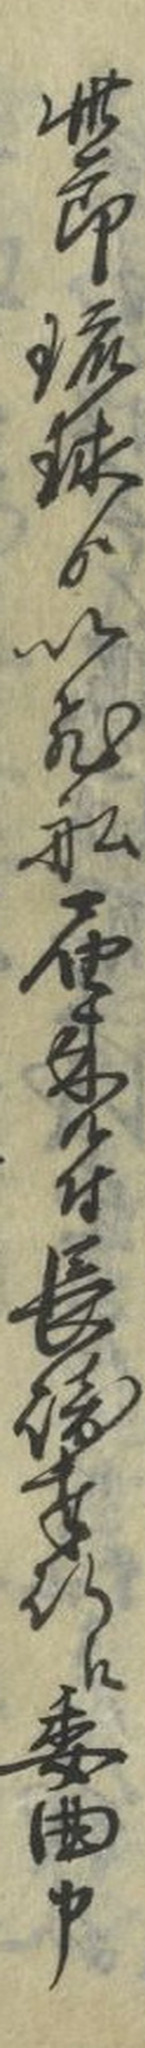此節琉球ゟ以飛船届来候付長崎奉行え委曲申
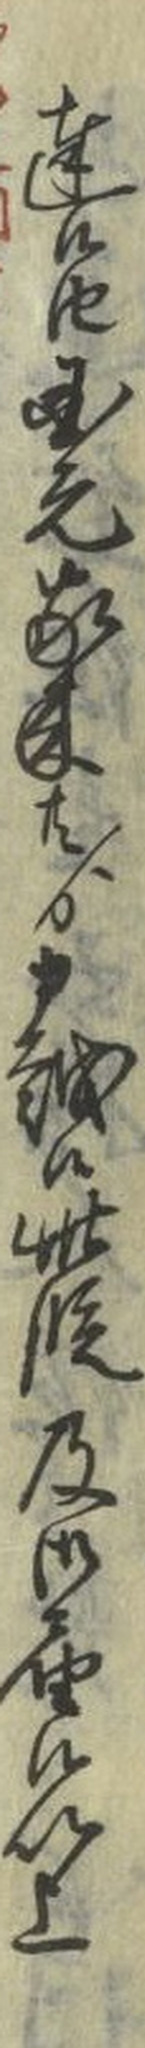達候由国元家来共ゟ申越候申越候此段及御届候以上
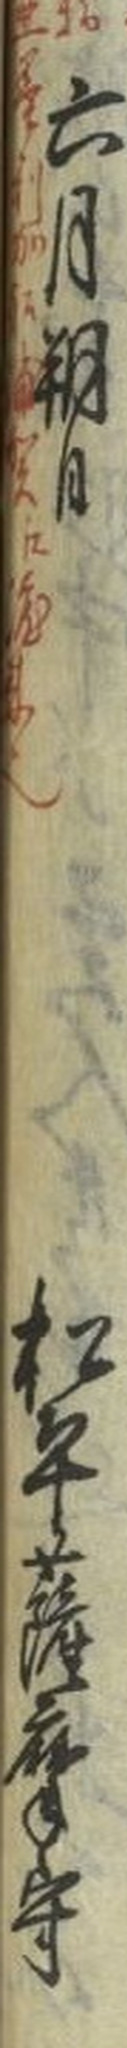六月朔日松平薩摩守
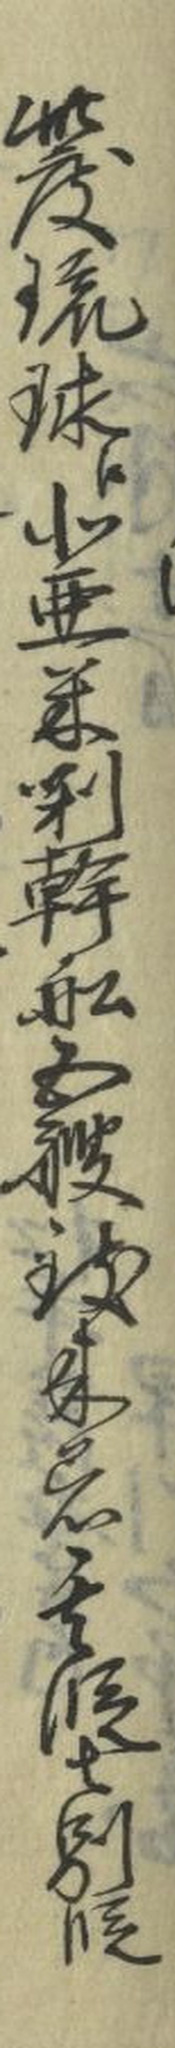此度琉球え北亜米唎幹船五艘致来着其段は別段
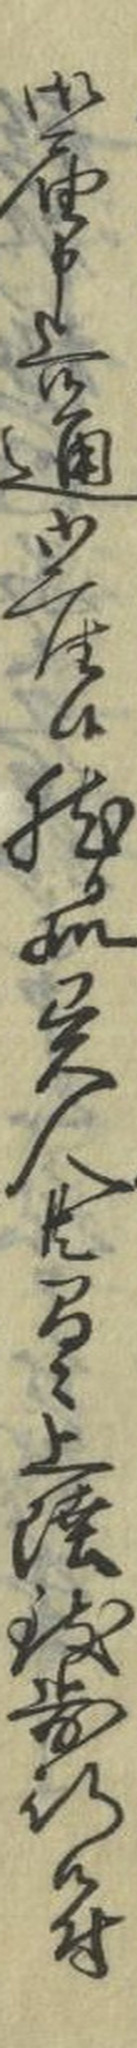御届申上候通御座候然る処異人共間々上陸致歩行候付
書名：琉球へアメリカ船渡来書
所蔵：University of the Ryukyus Library
